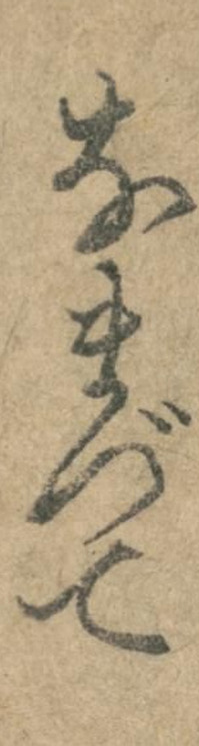なまづて
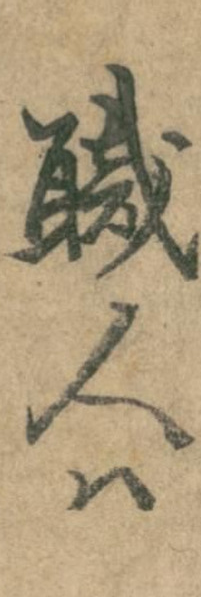職人は
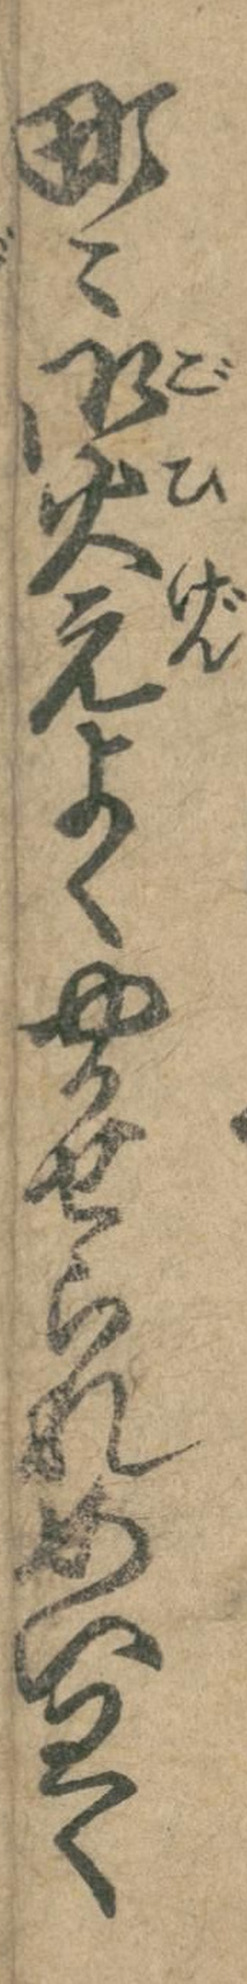町〻御火元よくゆりせられめいわく
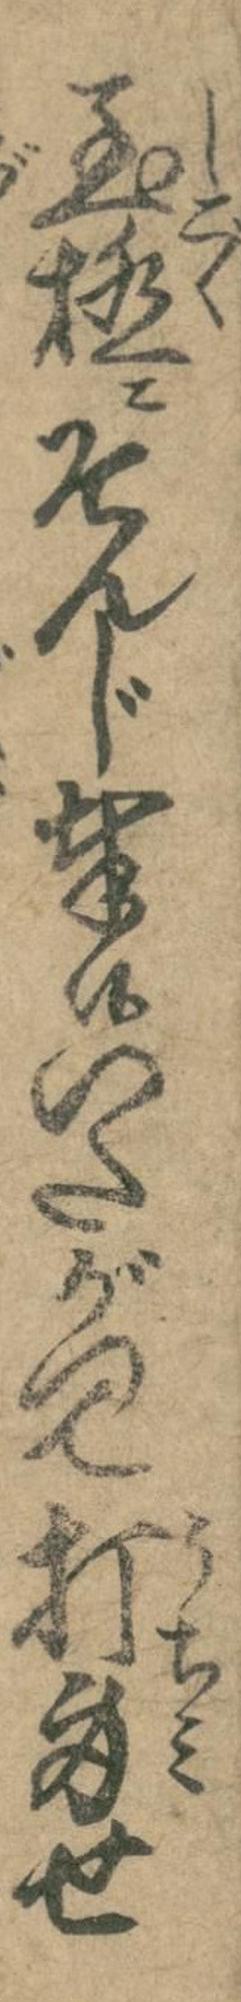至極ニそんじ奉候いたがつて打身せ
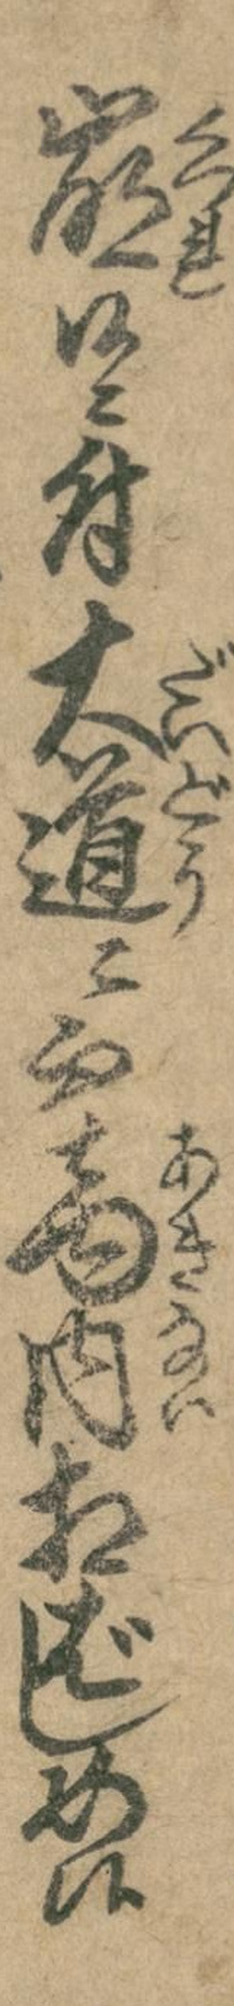崩候ニ付大道ニ而商内相はじめ候
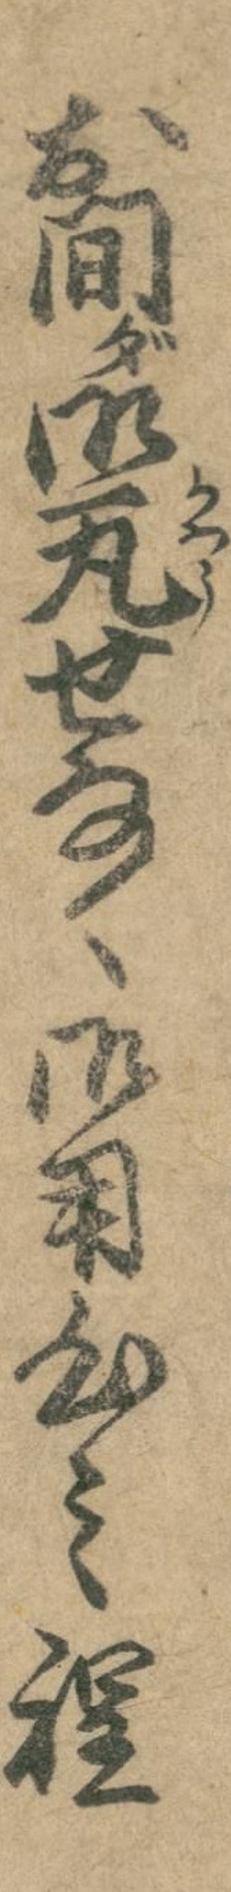於間ダ御瓦せなく御用心之程
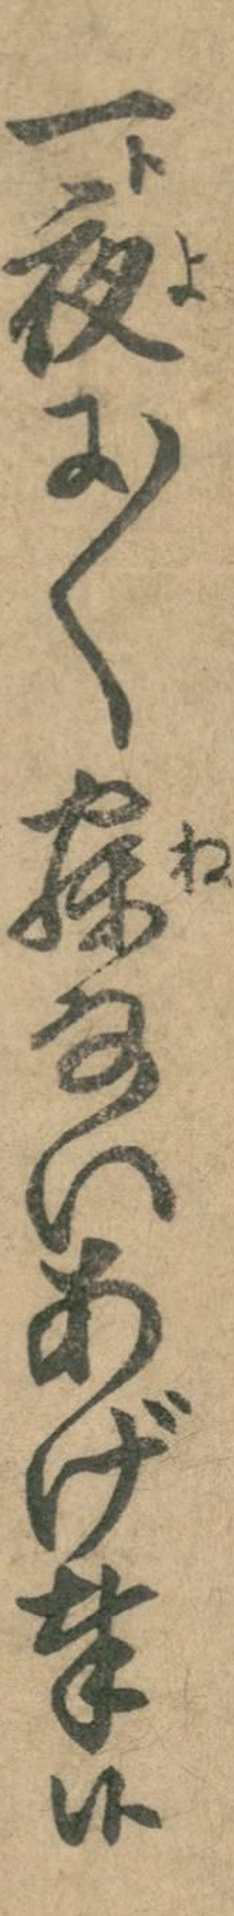一ト夜に〳〵寝ないあげ奉候
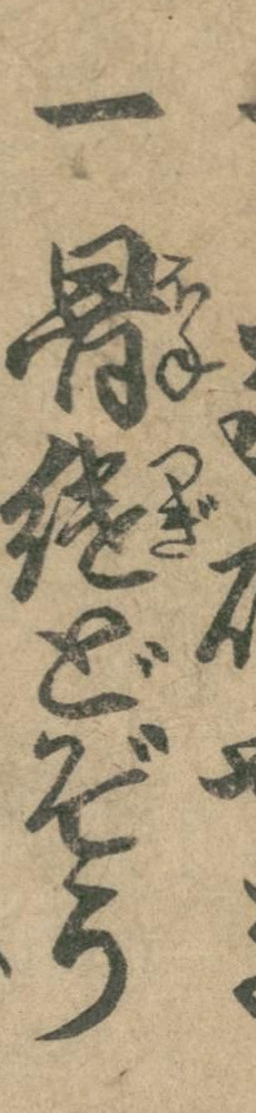一骨継どぞう
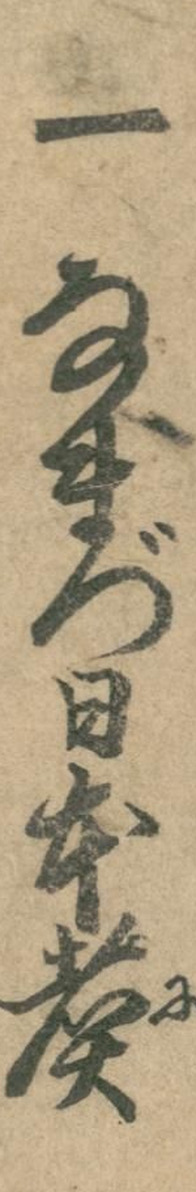一なまづ日本煮
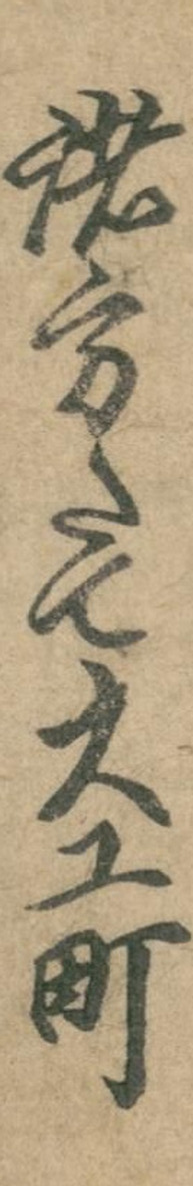諸方たて大工町
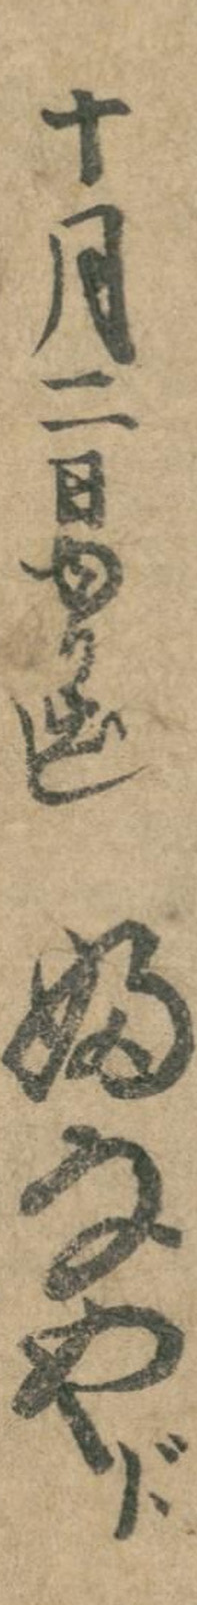十月二日ゆり出しふなやド
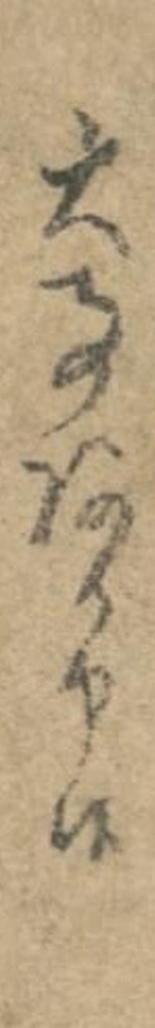大事あり申候
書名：江戸前かばやき鯰大火場焼
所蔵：東京大学地震研究所図書室 Earthquake Research Institute Library, The University of Tokyo, JAPAN
